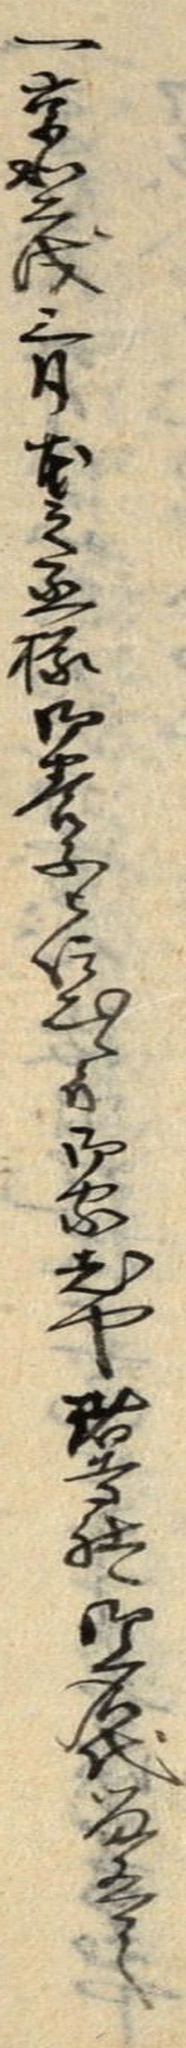一享和二戌三月本之丞様御養子被仰出候に付御家老中諸寺社へ御名代留有之
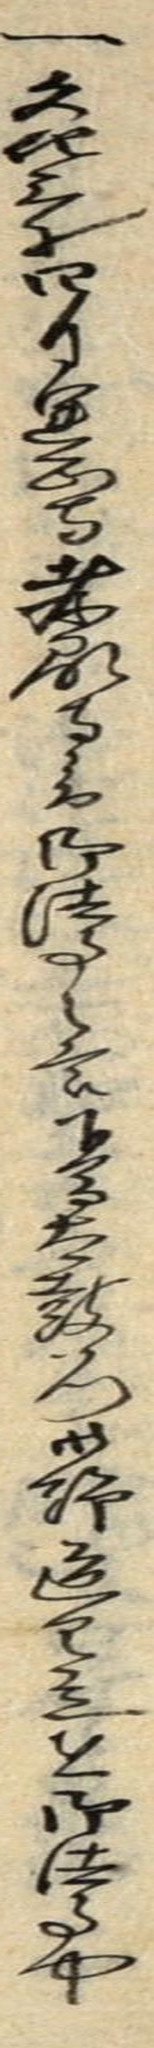一文化三寅四月運正寺孝顕寺に而御法事之節下馬太鼓御門御飾道具立を御法事中
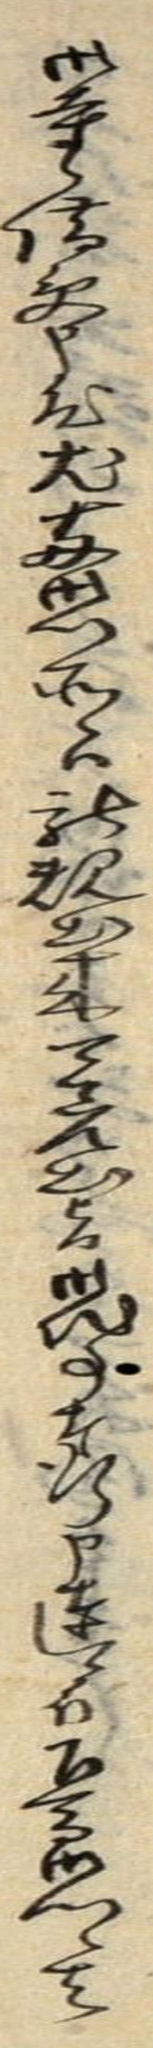御寺借受申度尤両御門所には新規出来可差出旨御作事奉行申達候に付下馬御門へは

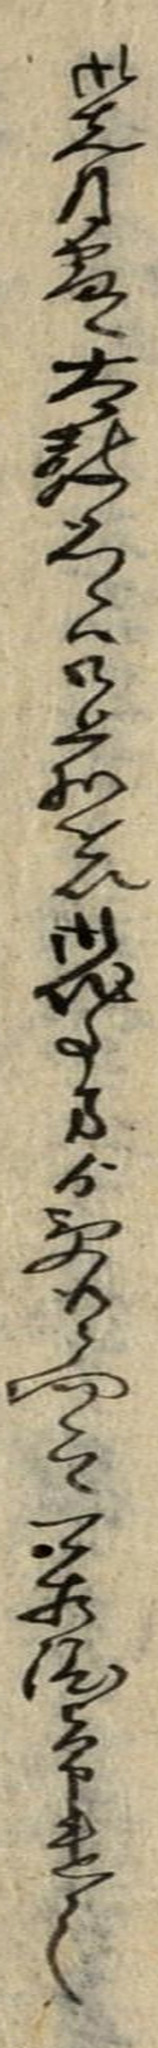御先月番へ太鼓御門へは口上扣を以御作事方ゟ受取候向に候はゝ可相渡旨申遣之
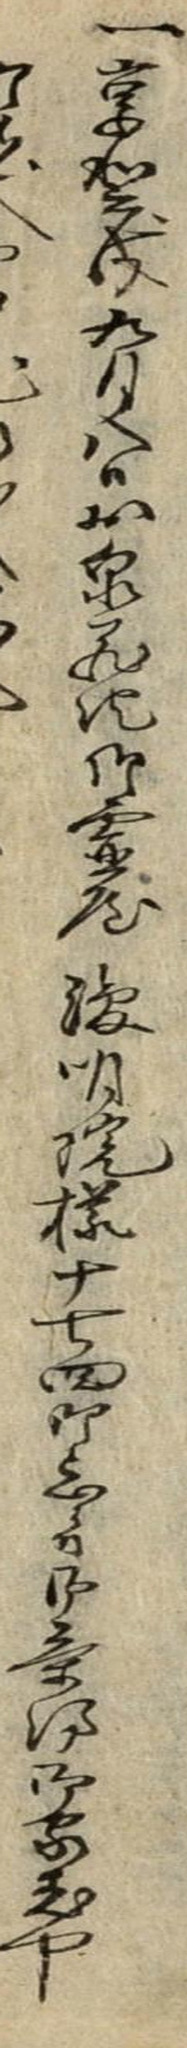一享和二戌九月八日於泉蔵院御霊屋浚明院様十七回御忌に付御茶湯御家老中
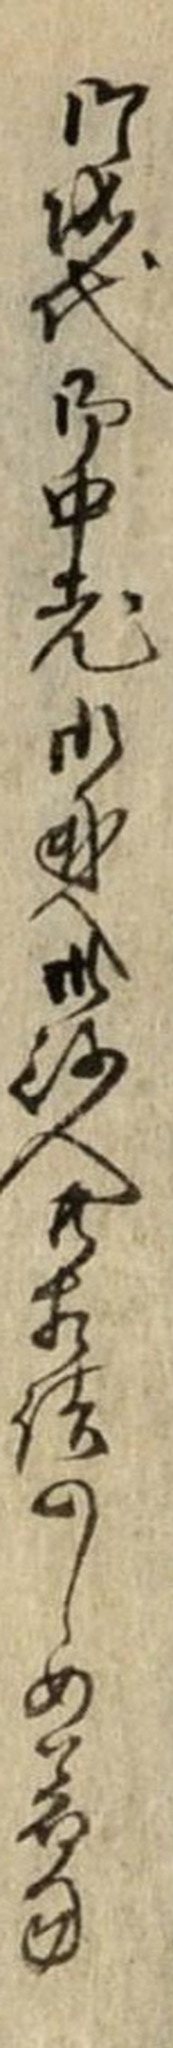御城代御中老御用人御役人共相詰のしめ着用
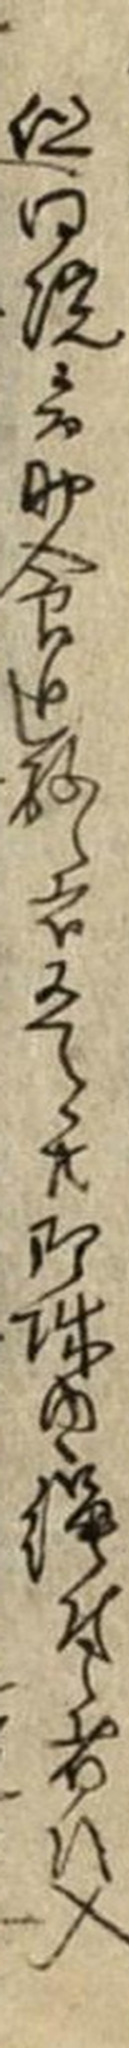但同院に而助命追放之者有之候共御城内へ縄付之者引入
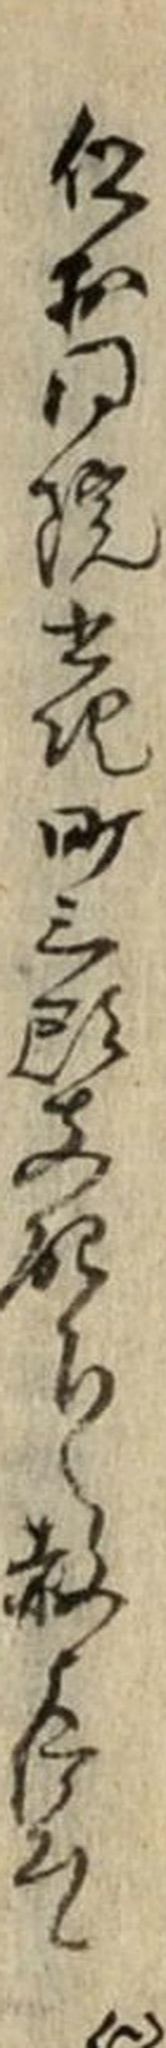但於同院書院町三郡支配下々赦被仰出候
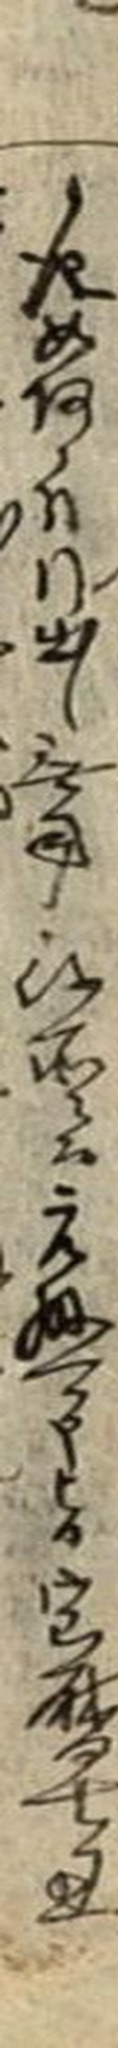之儀如何に付引出無用役所に而取扱可申旨宝暦七丑
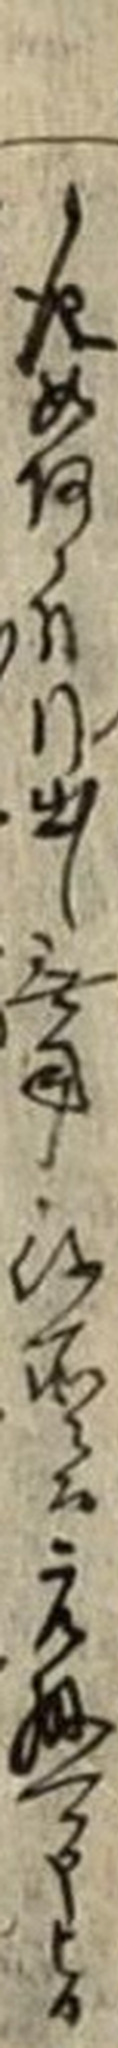之儀如何に付引出無用役所に而取扱可申旨宝暦七丑
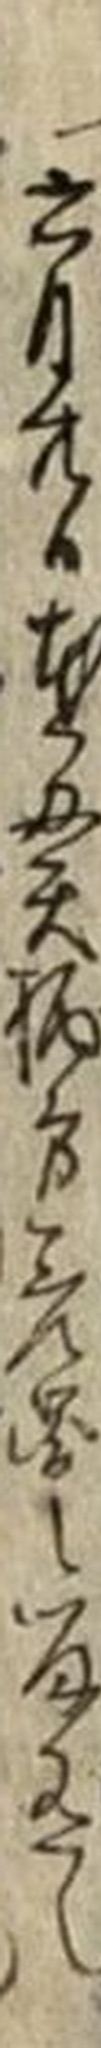六月廿日本多矢柄方差図之留有之
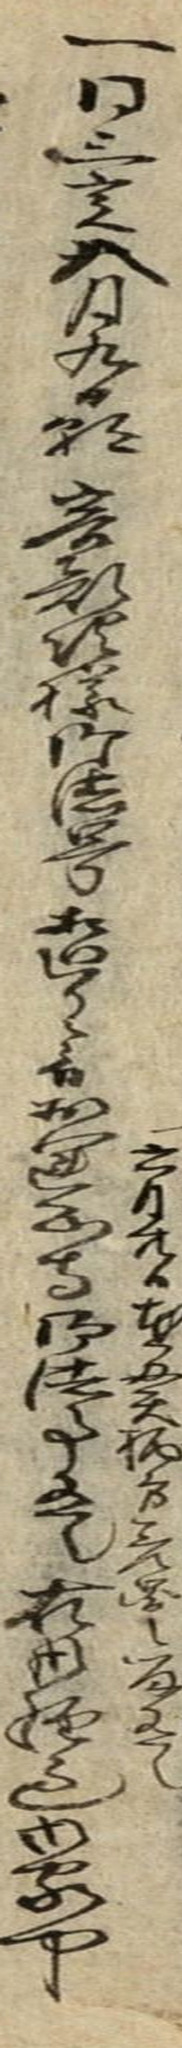一同三亥八月九日容顔院様御法号相廻り候付於運正寺御法事有之候右御経過御家中
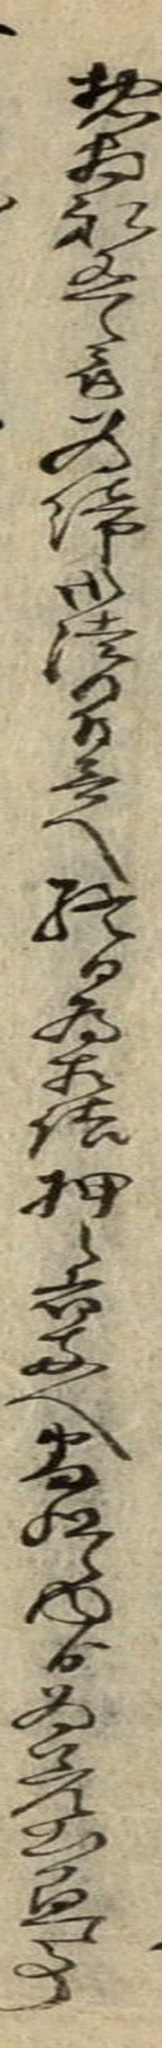惣拝礼有之候付為締御徒目付壱人終日為相詰押之者両人番組之内ゟ為指出置候事
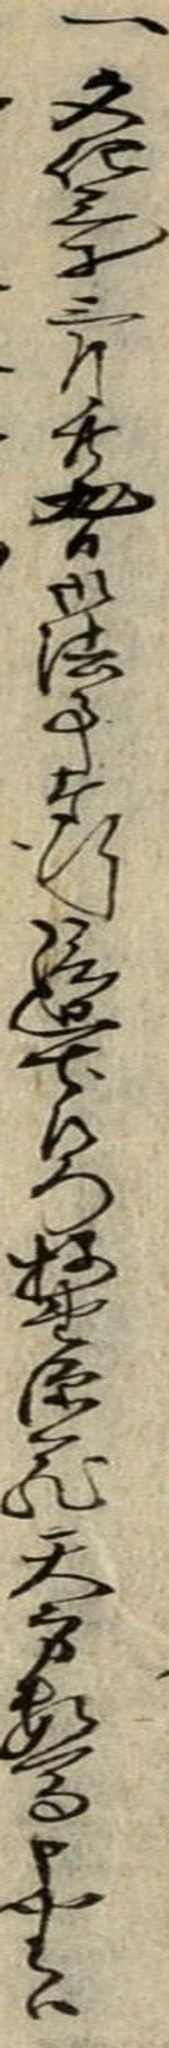一文化三寅三月廿五日御法事奉行渡辺十郎左衛門牧野源蔵天方数馬申聞候は
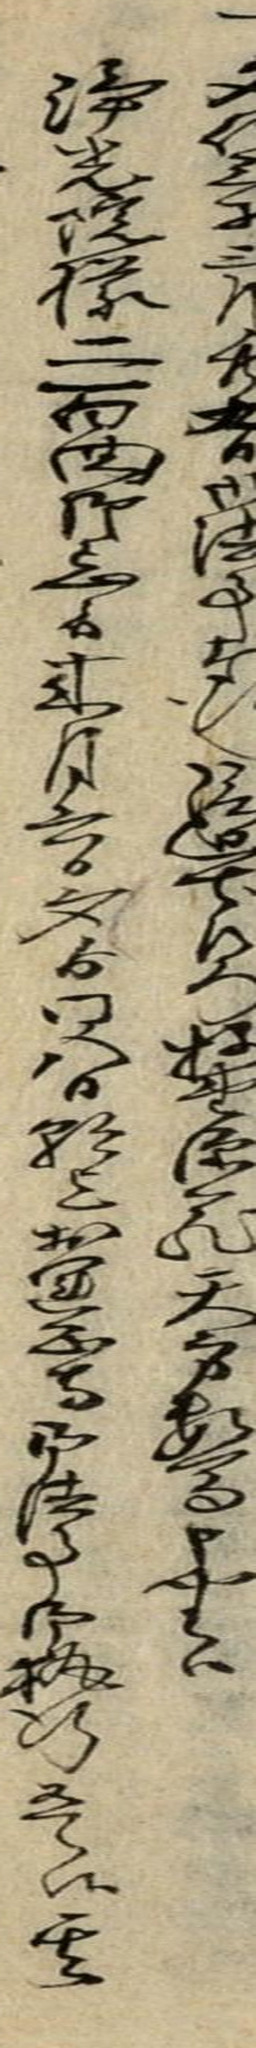浄光院様二百回御忌に付来月六日夕ゟ八日朝迄於運正寺御法事御執行有之候其
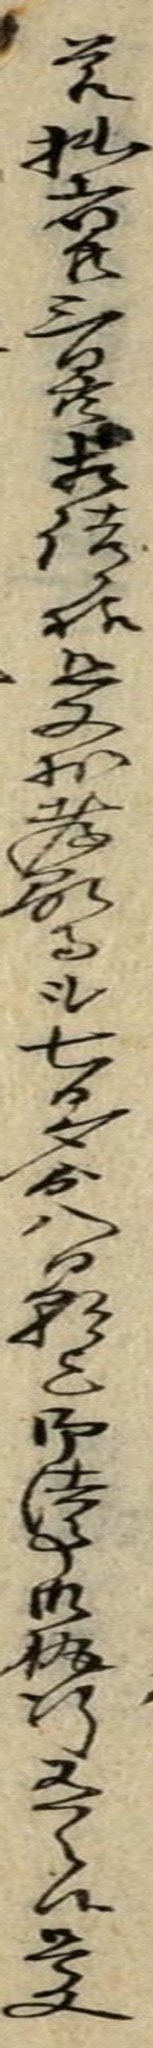節拙者共三日共相詰候様且又於孝顕寺も七日夕ゟ八日朝迄御法事御執行有之候且又
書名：蒐輯之部
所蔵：福井県文書館 Fukui Prefectural Archives
